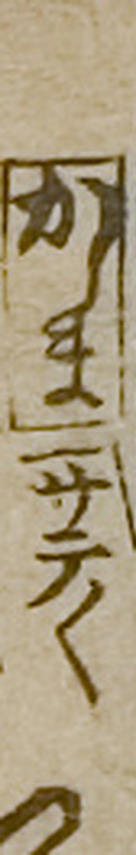かしま〽サテ〳〵
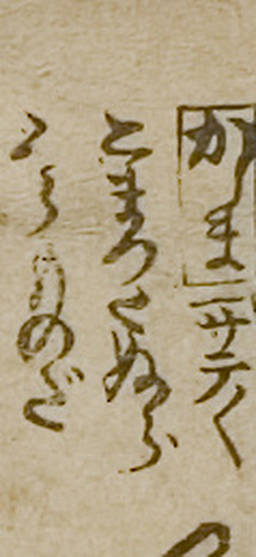こまつたぬら
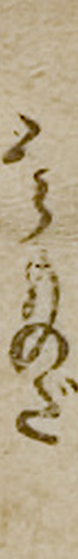くらものだ
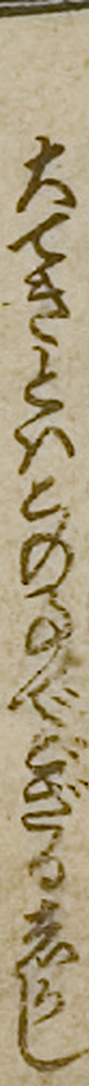大てきとハこの事でござるしかし
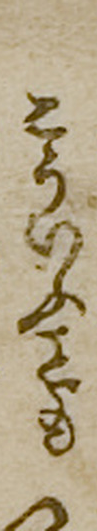こういふことも
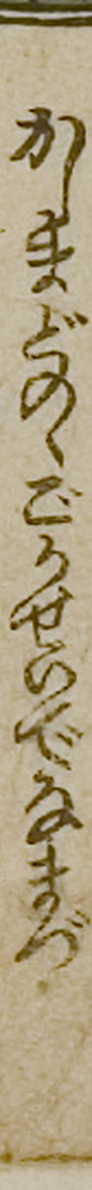かしまどのゝごかせいでなまづ
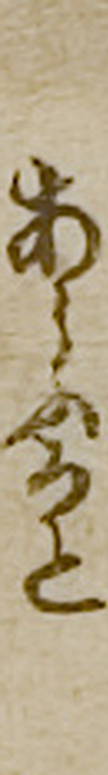あらふかと
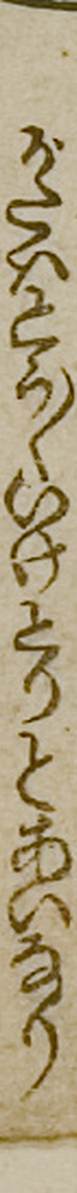かたハとう〳〵いけとりとあいなり
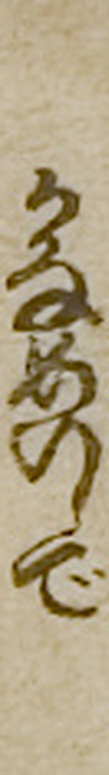かなめいしで
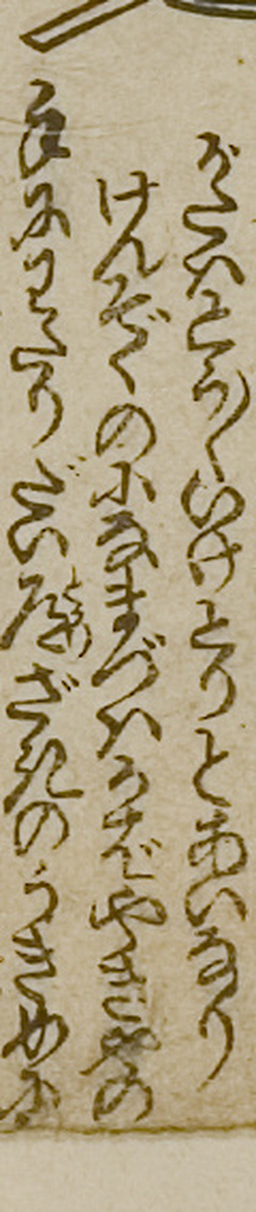けんぞくの小なまづハかばやきやの
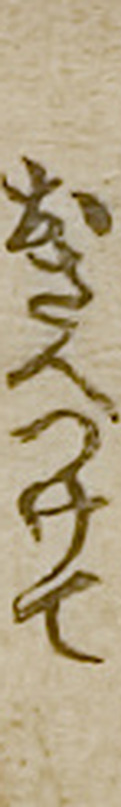おさへつけて
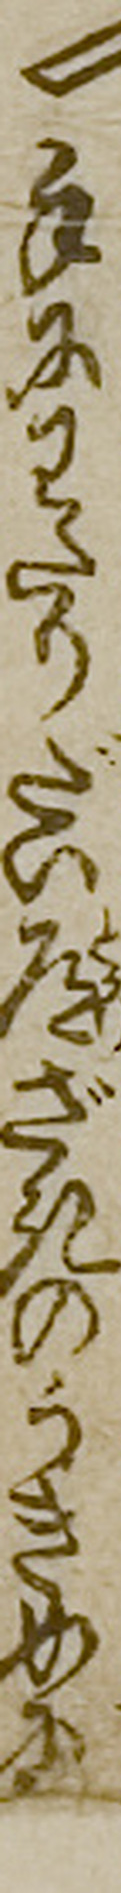手にわたりだい道ざきのうきめに
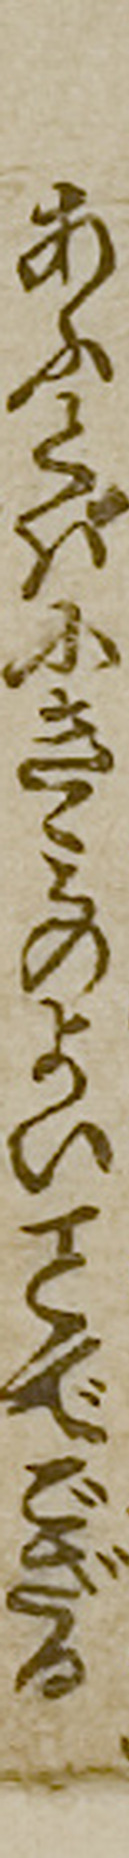あふてバ小きミのよいことでござる
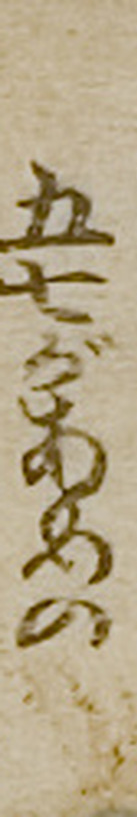五七があめの
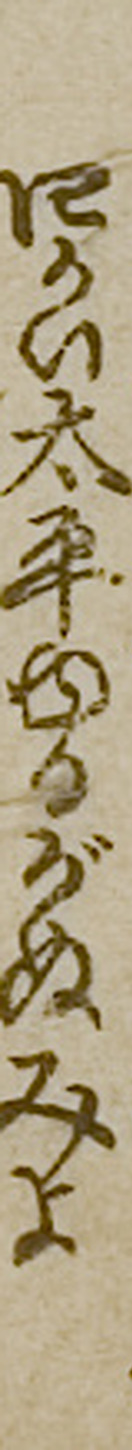四かい太平ゆるがぬみよ
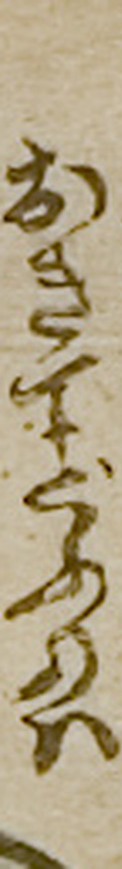おきてどふりハ
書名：おそろ感心要石
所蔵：東京大学総合図書館 General Library in the University of Tokyo, JAPAN
